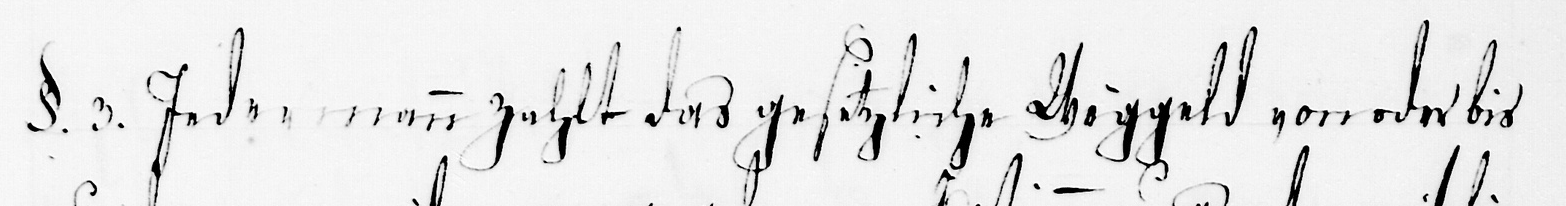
§. 3. Jedermann zahlt das gesetzliche Weggeld von oder bis
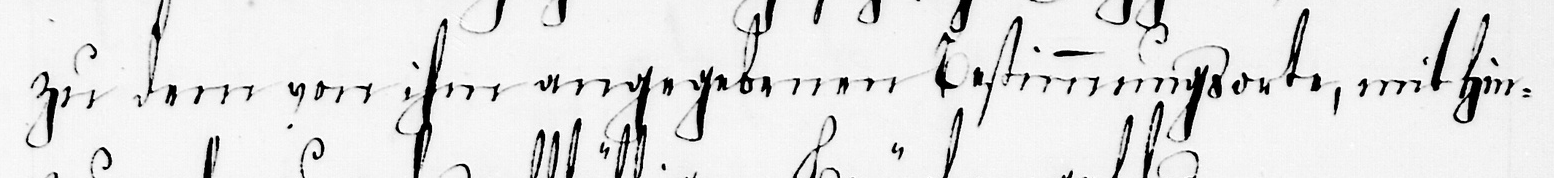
zu dem von ihm angegebenen Bestimmungsorte, mit Hin¬
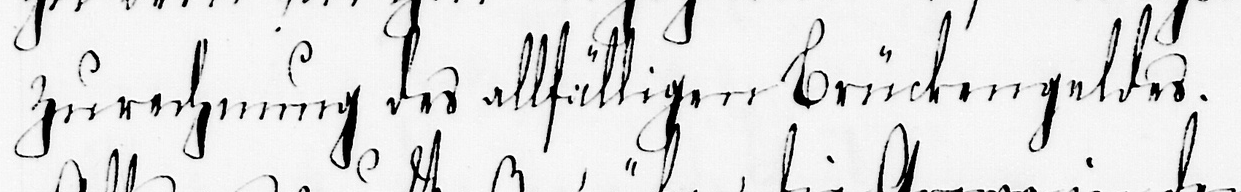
zurechnung des allfälligen Brückengeldes.
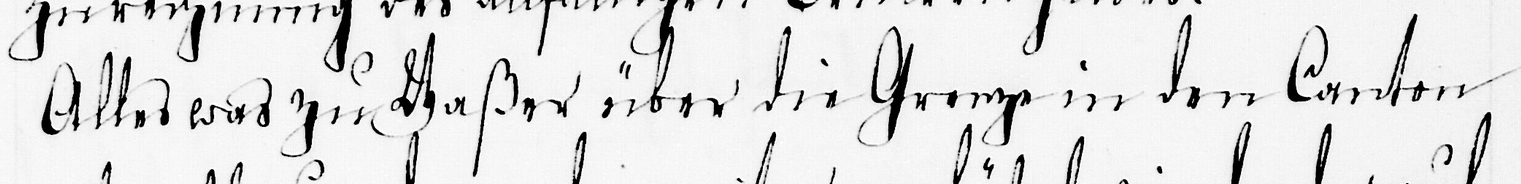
Alles was zu Waßer über die Grenze in den Canton
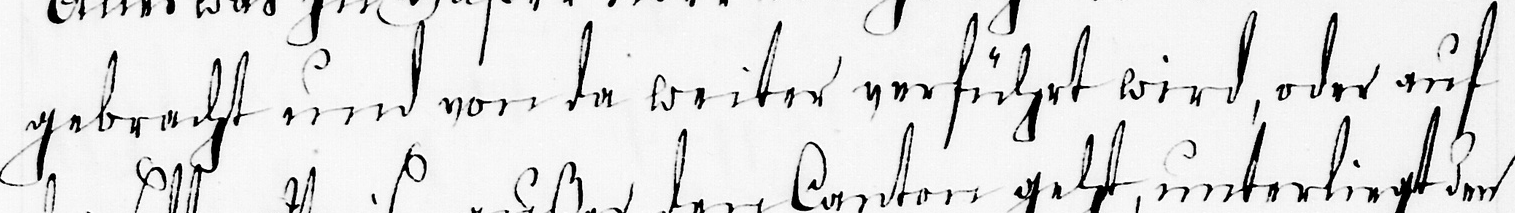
gebracht und von da weiter verführt wird, oder auf
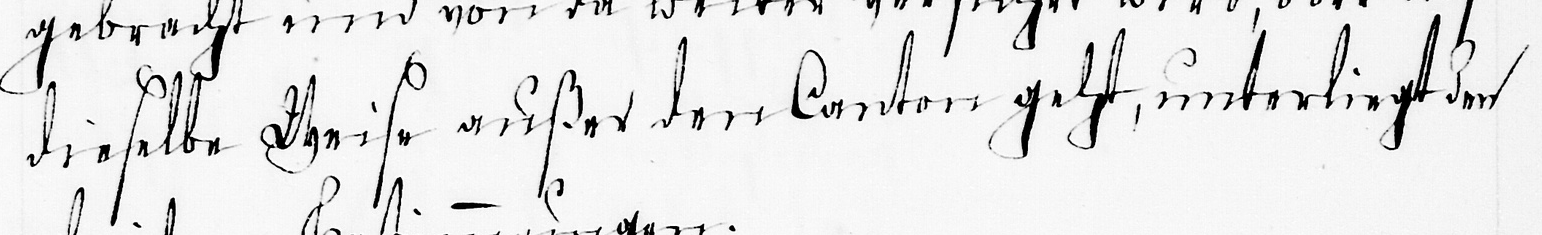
dieselbe Weise außer den Canton geht, unterliegt den
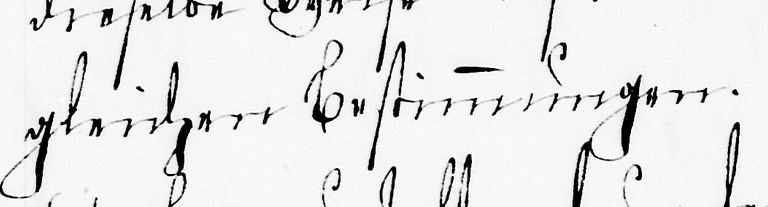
gleichen Bestimmungen.
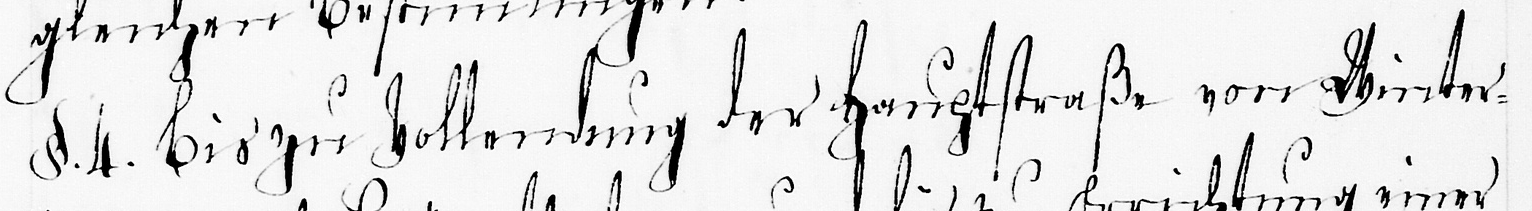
§. 4. Bis zu Vollendung der Hauptstraße von Winter¬
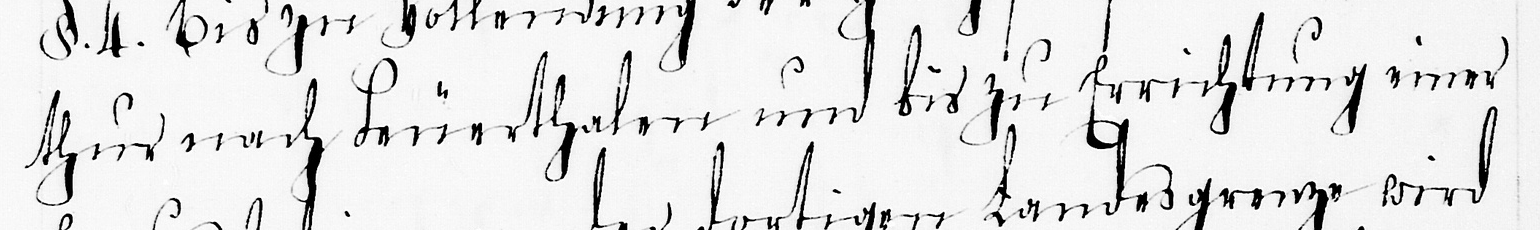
thur nach Feuerthalen und bis zu Errichtung einer
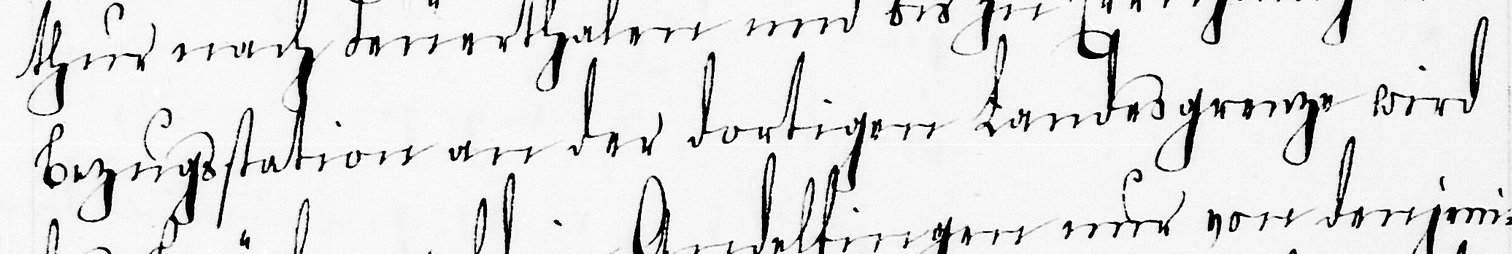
Bezugsstation an der dortigen Landesgrenze wird
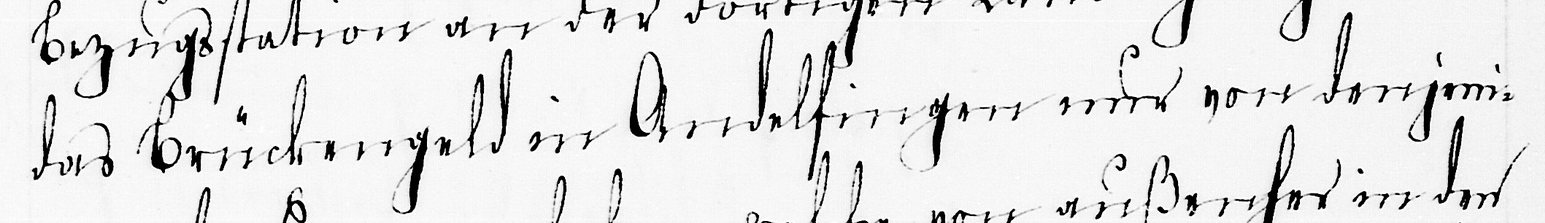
das Brückengeld in Andelfingen nur von denjeni¬
